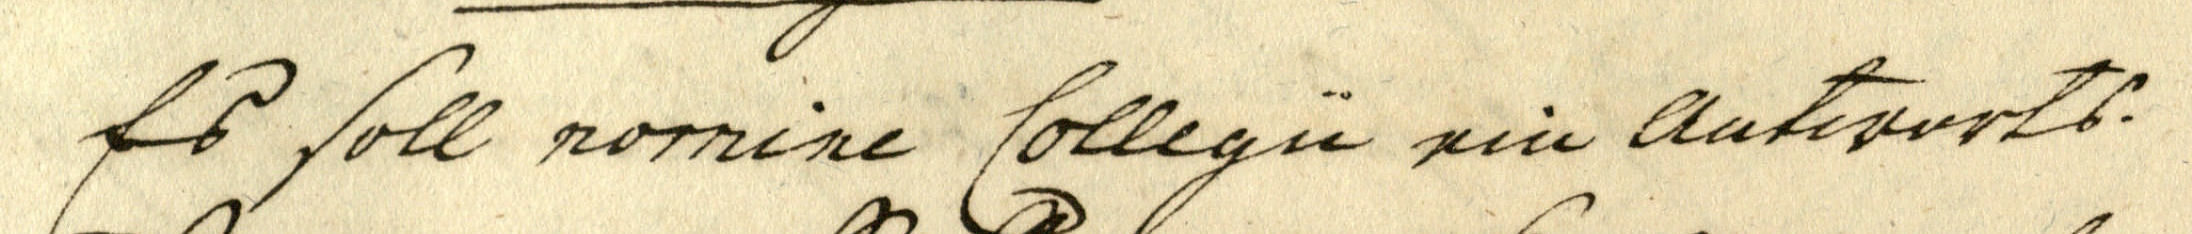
Es soll nomine Collegii ein Antworts¬
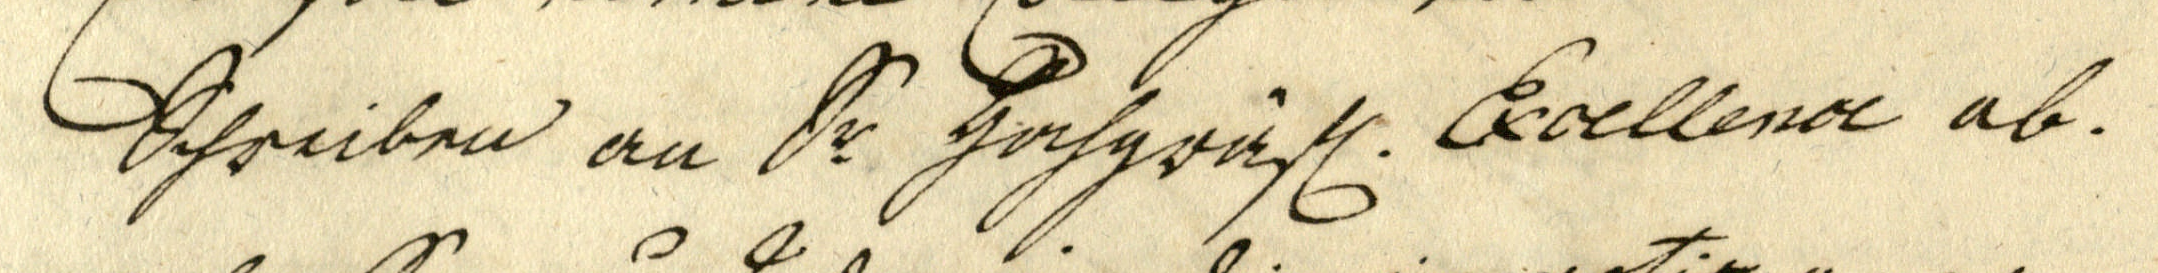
Schreiben an Sr Hochgräfl. Excellence ab¬
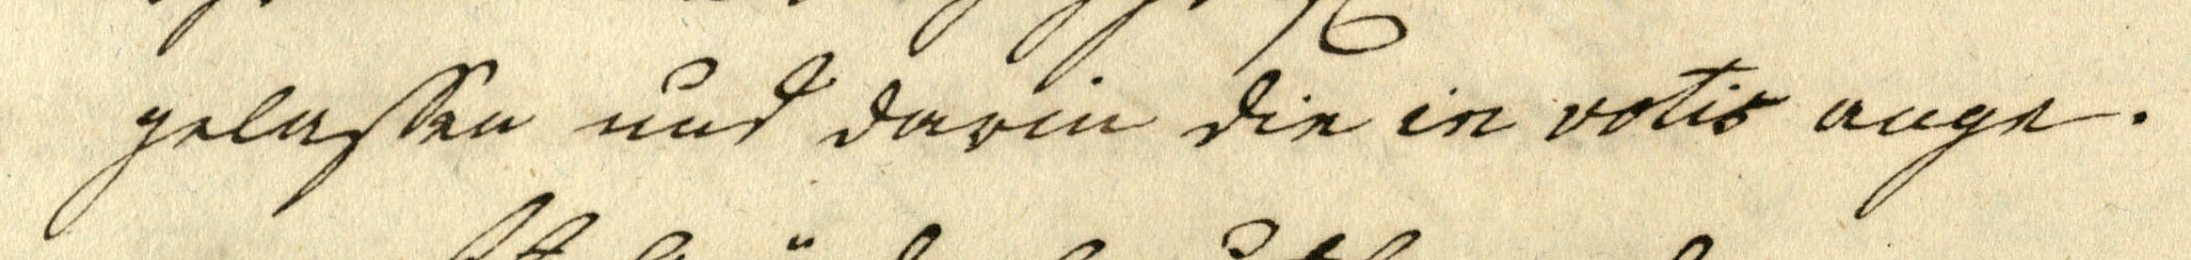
gelassen und darin die in votis ange¬
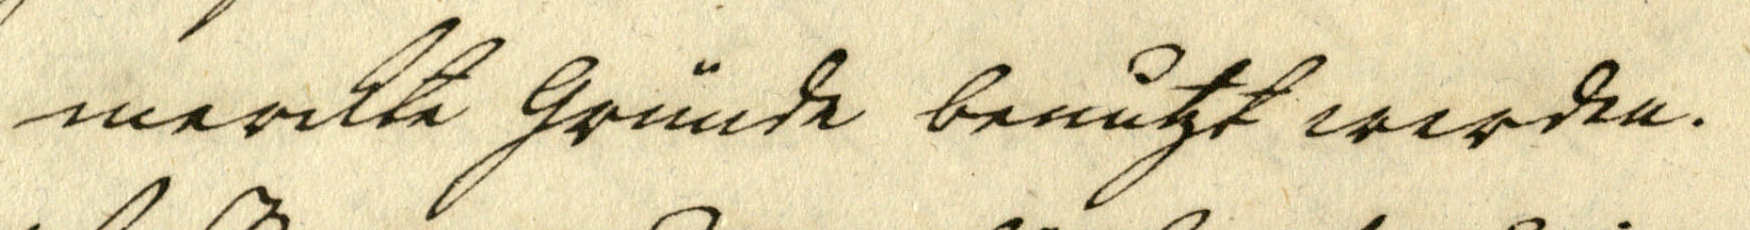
merckte Gründe benutzt werden.
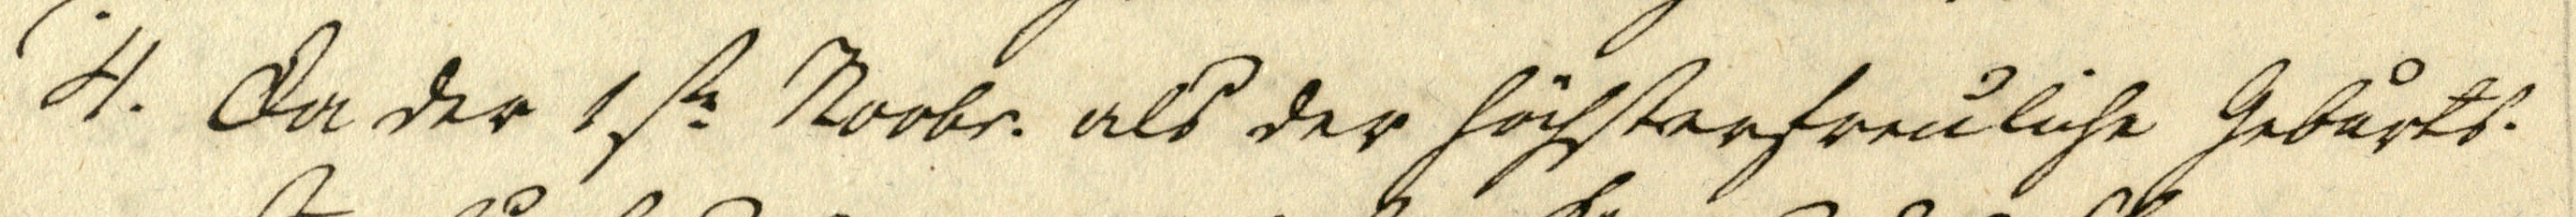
4. Da der 1 t. Novbr. als der höchsterfreuliche Geburts¬
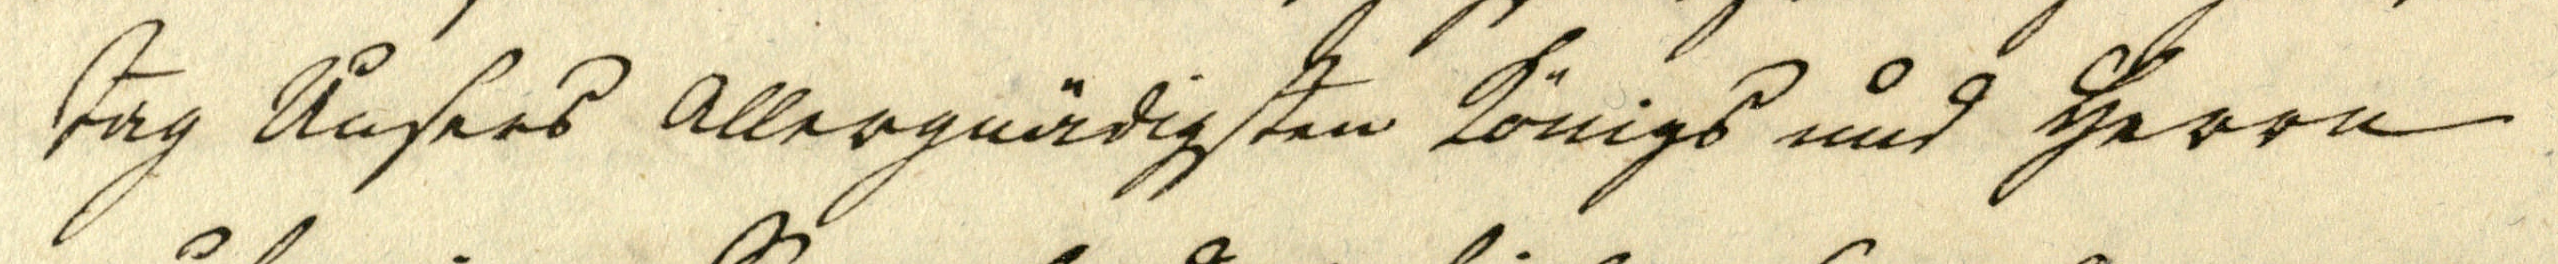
Tag Unsers Allergnädigsten Königs und Herrn
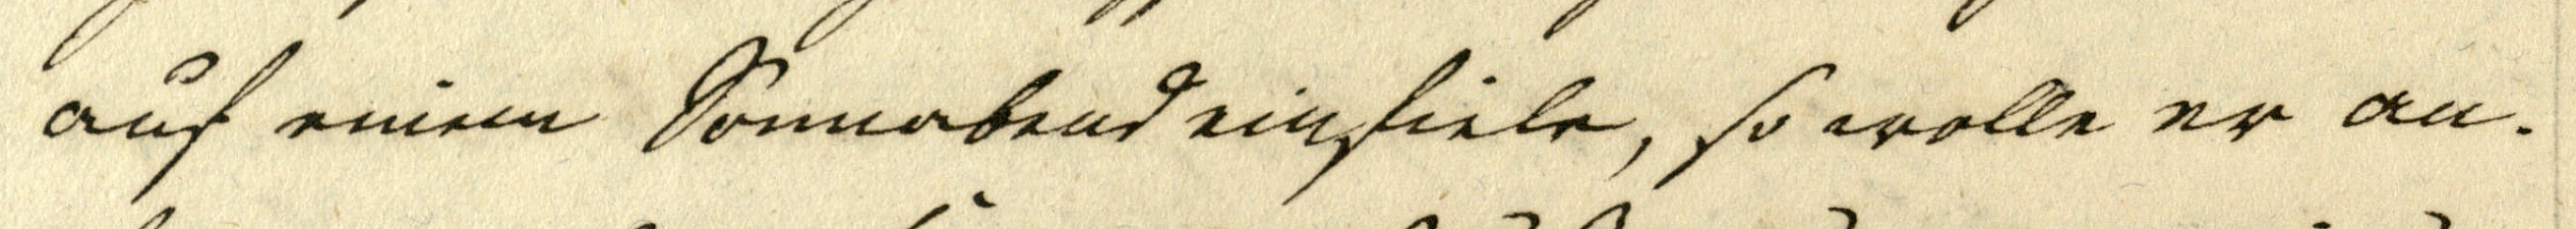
auf einem Sonnabend einfiele, so wolle er an¬
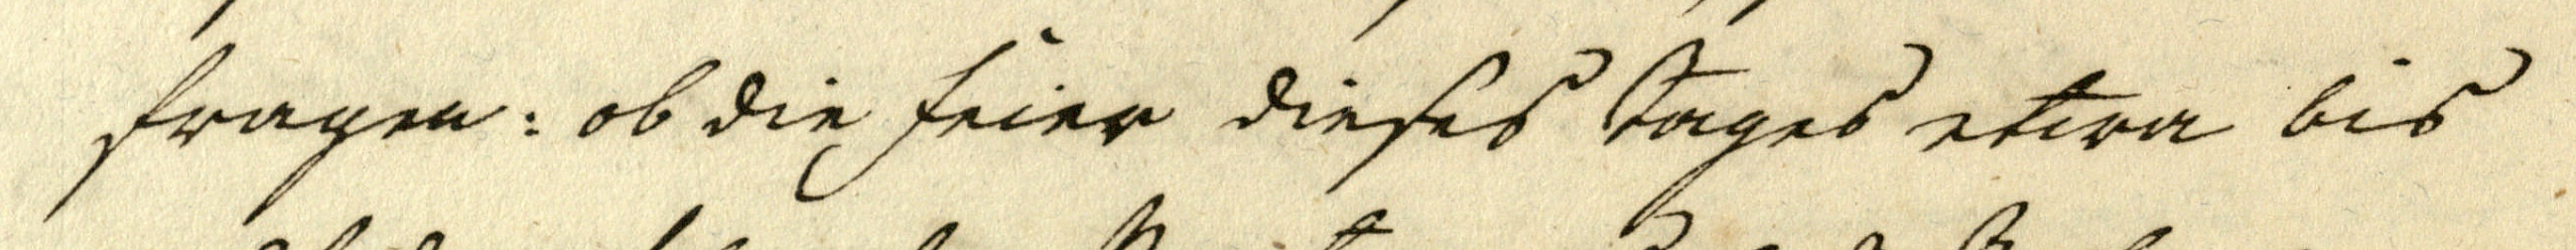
fragen: ob die Feier dieses Tages etwa bis
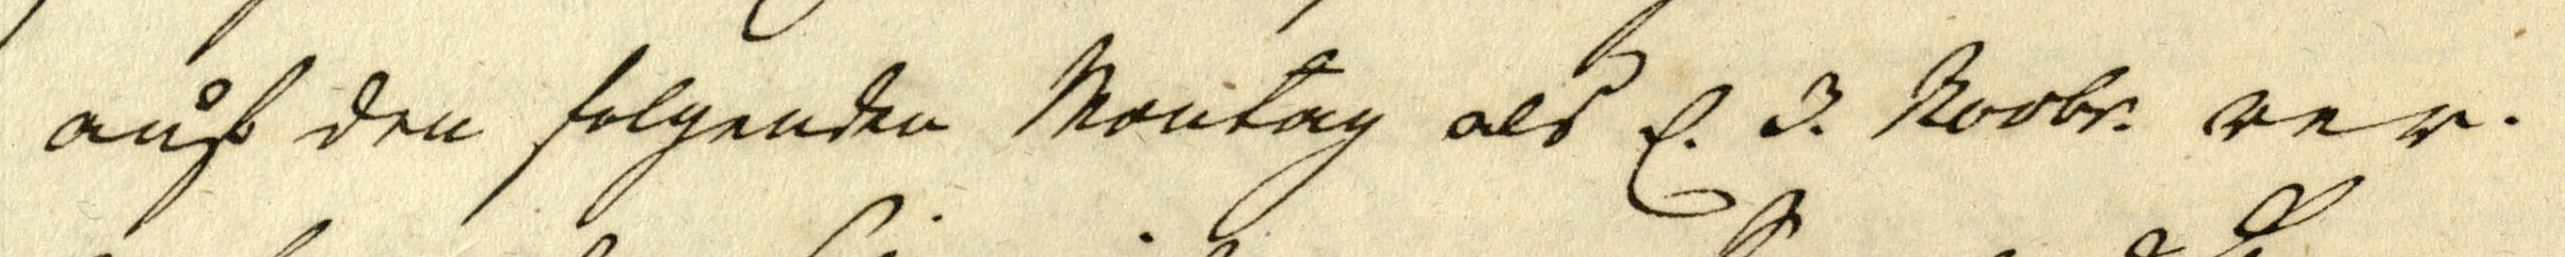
auf den folgenden Montag als d. 3. Novbr. ver¬
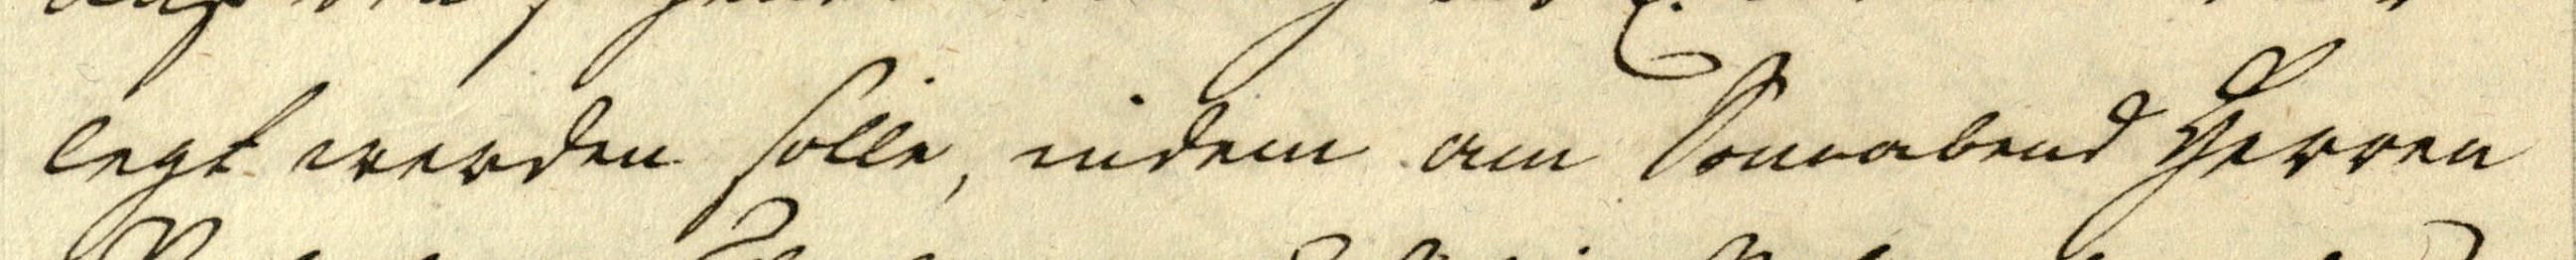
legt werden solle, indem am Sonnabend Herren
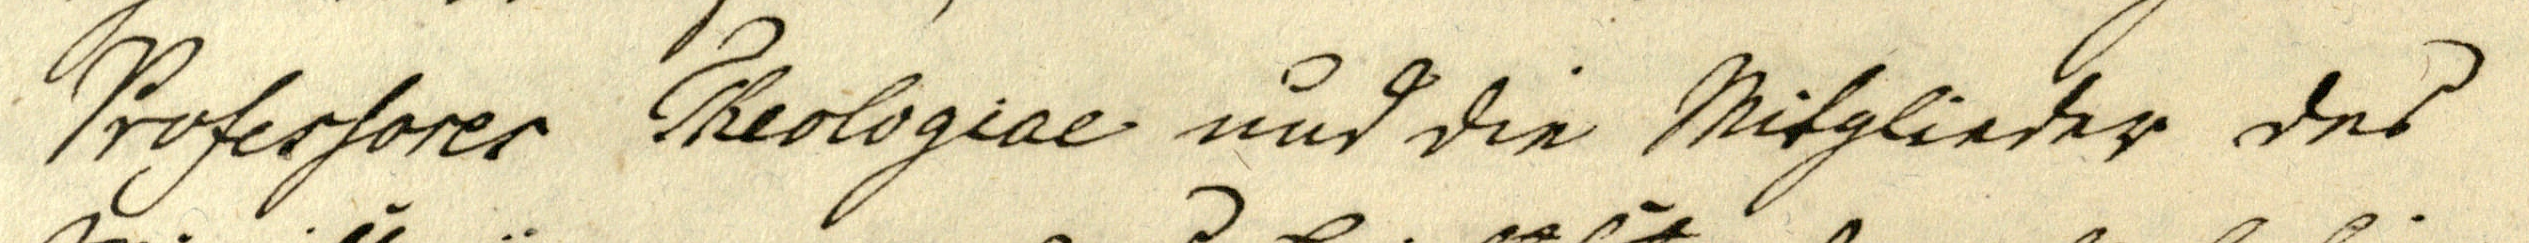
Professores Theologiae und die Mitglieder des
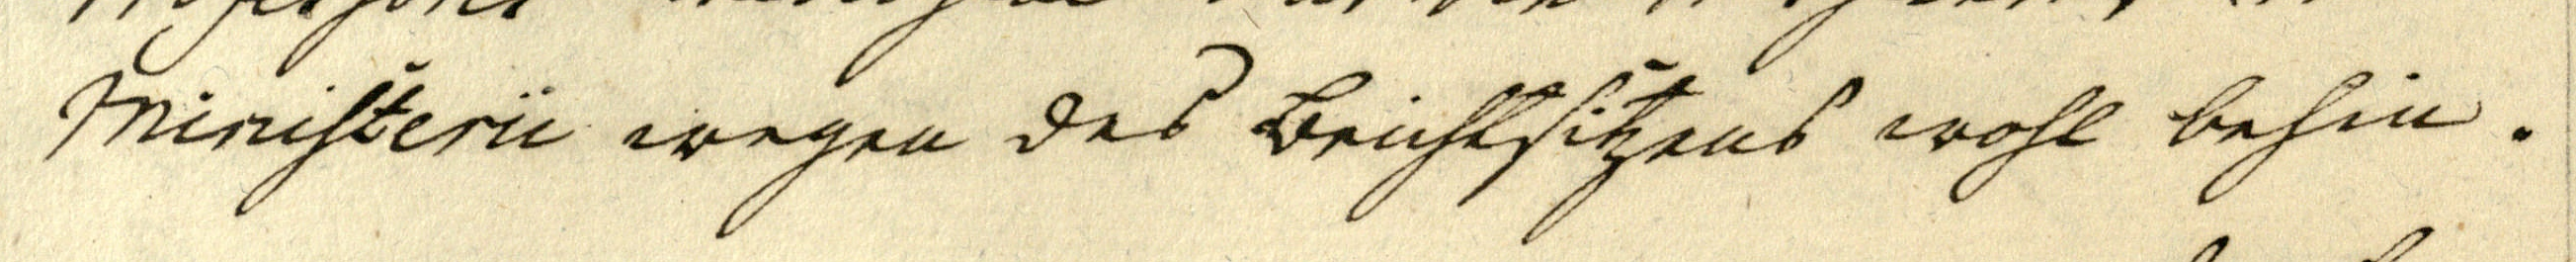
Ministerii wegen des Beichtsitzens wohl behin¬
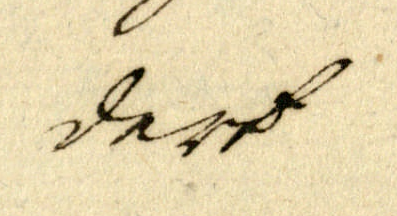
dert
